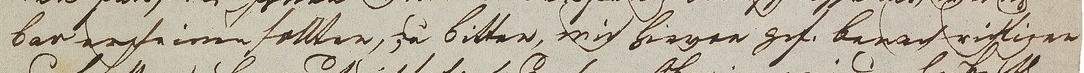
bar erscheinen sollten, zu bitten, mich hievon gef. benachrichtigen
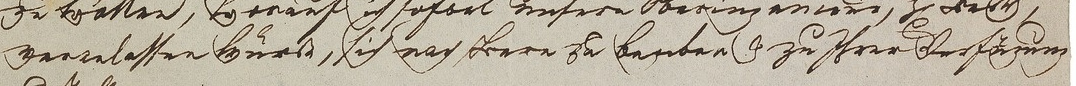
veranlassen würde, sich nach Bern zu begeben & zu Ihrer Verfügung
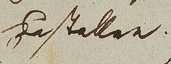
zu stellen.
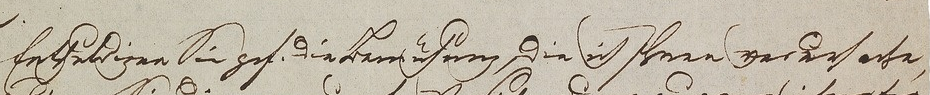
Entschuldigen Sie gef. die Bemühung, die ich Ihnen verursache,
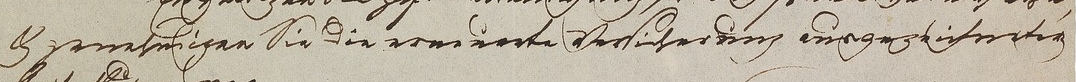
& genehmigen Sie die erneuerte Versicherung ausgezeichneter
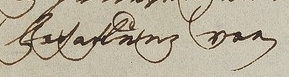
Hochachtung von
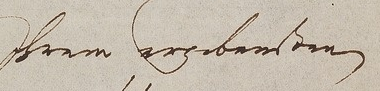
Ihrem ergebensten
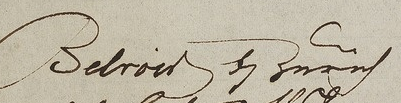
Belvoir bei Zürich
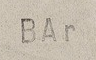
1858.
